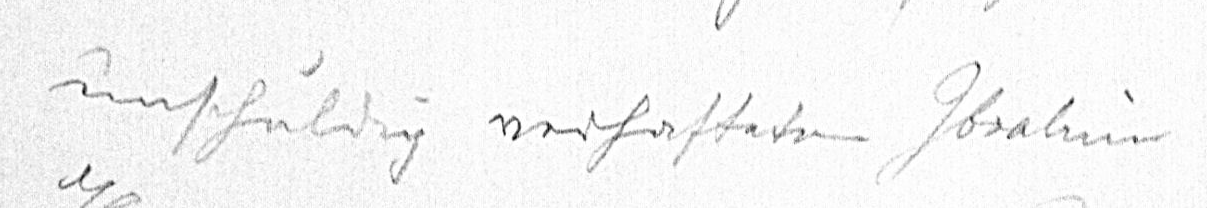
unschuldig verhafteten Ibrahim
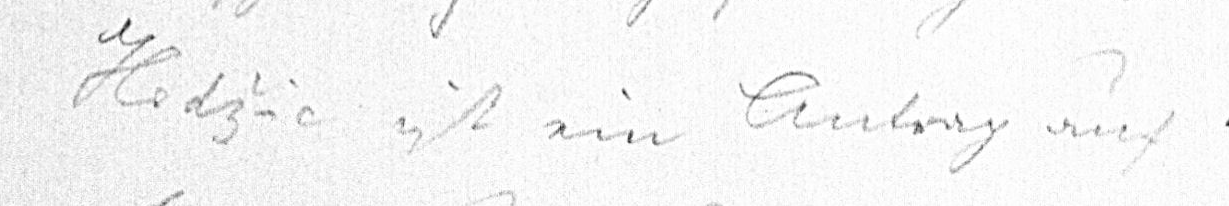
Hodzić ist ein Antrag auf
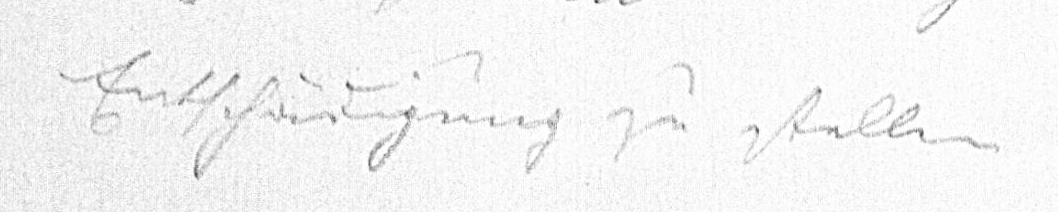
Entschädigung zu stellen
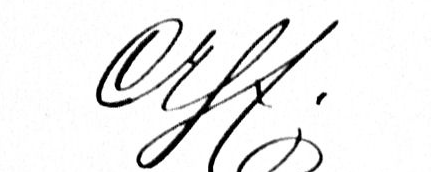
Ahf.
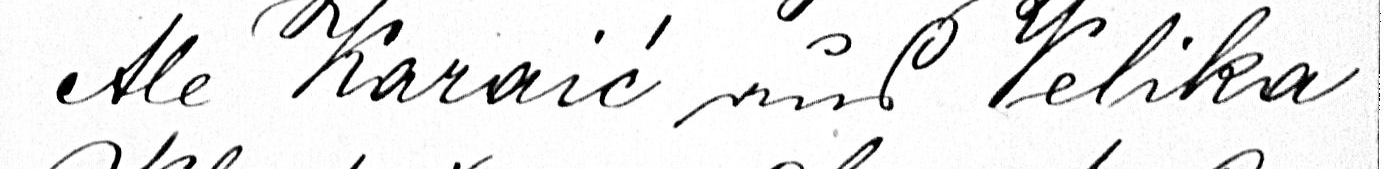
Ale Karaić aus Velika
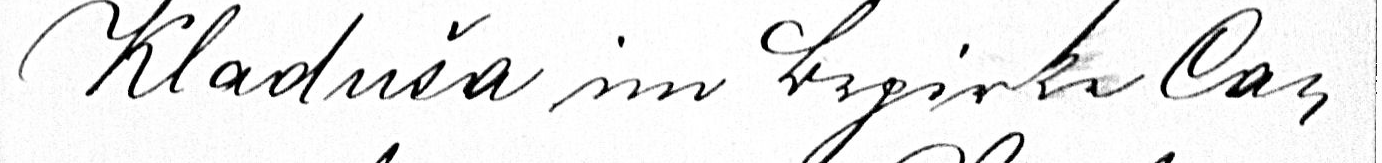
Kladusa im Bezirke Ca¬
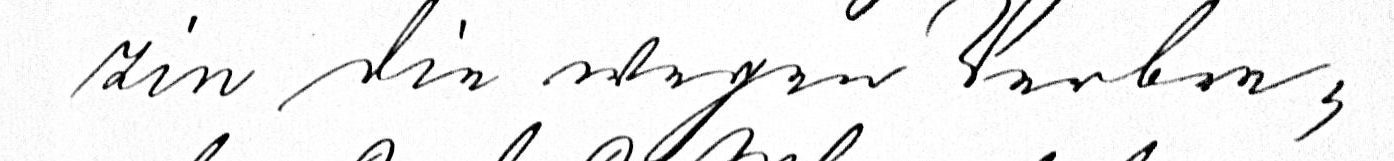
zin die wegen Verbre¬
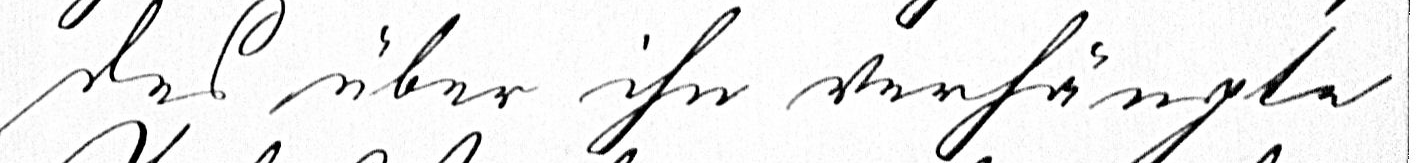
des über ihn verhängte
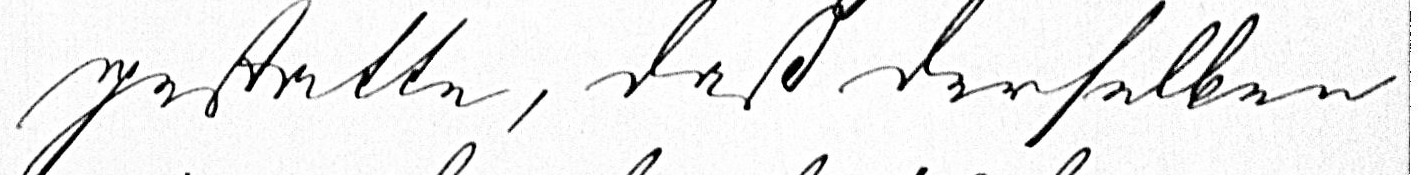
gestatte, daß derselben
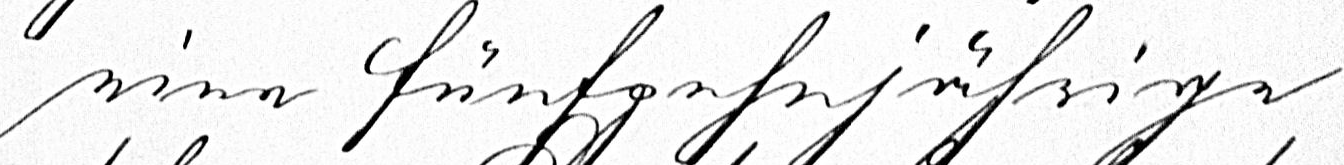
eine fünfzehnjährige
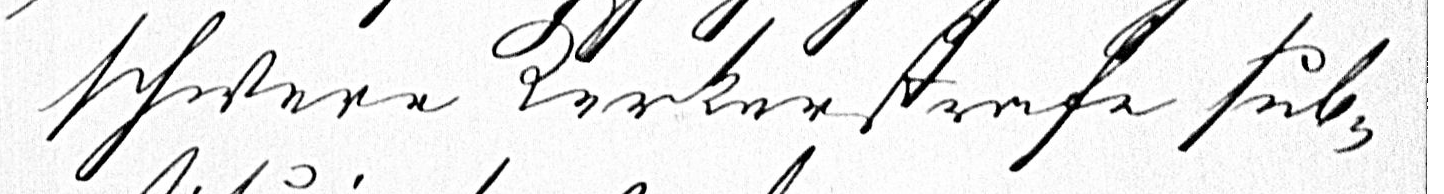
schwere Kerkerstrafe sub¬
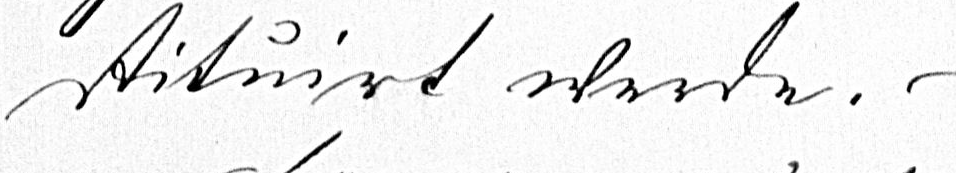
stituirt werde.
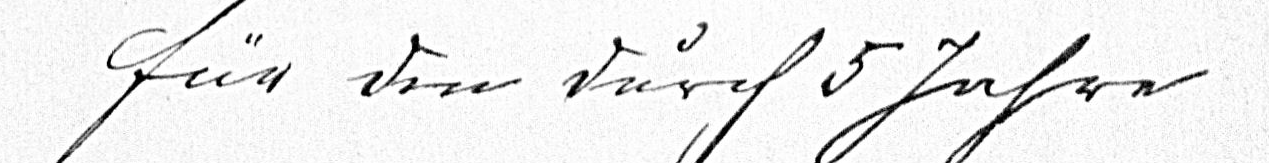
Für den durch 5 Jahre
